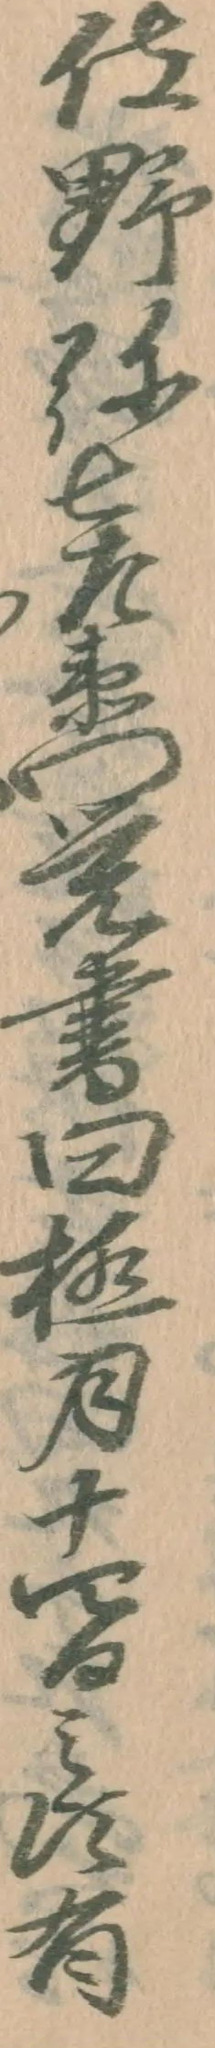佐野弥七左衛門覚書曰極月十四日之頃有
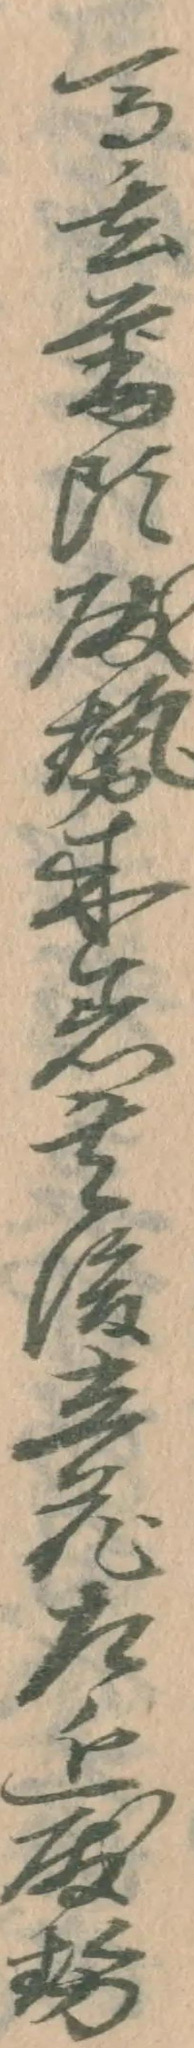馬玄蕃頭殿勢来着其後立花左近殿勢
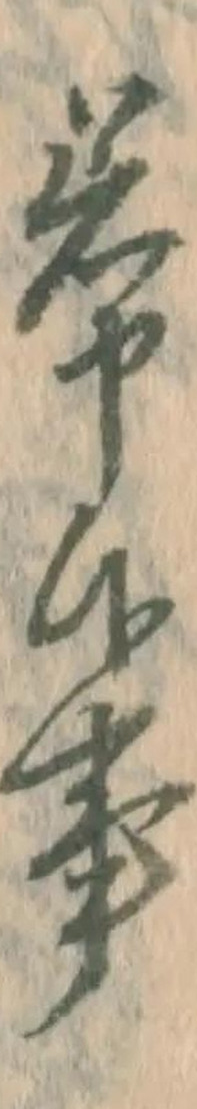着申候事
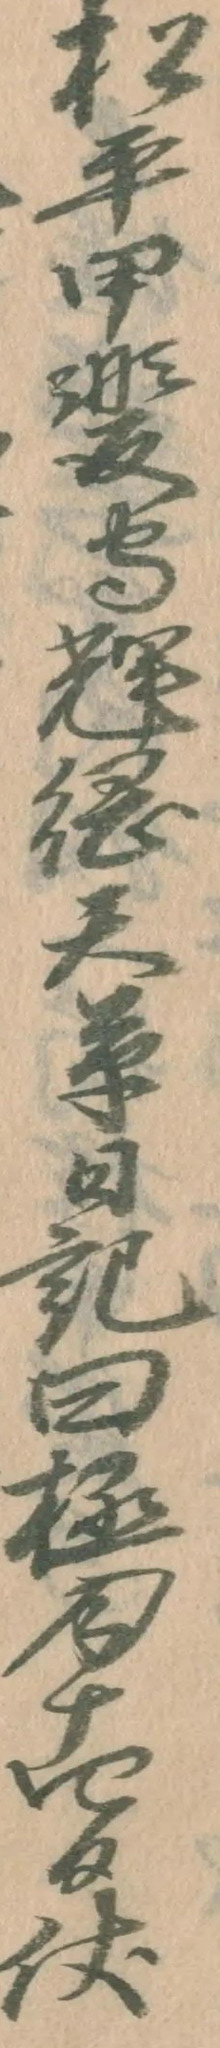松平甲斐守輝綱天草日記曰極月十四日伏
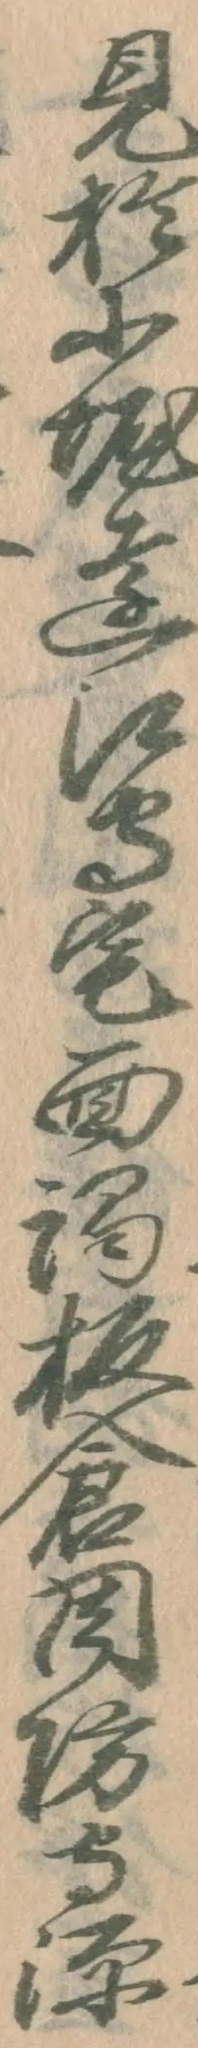見於小堀遠江守宅面鍋板倉周防守源
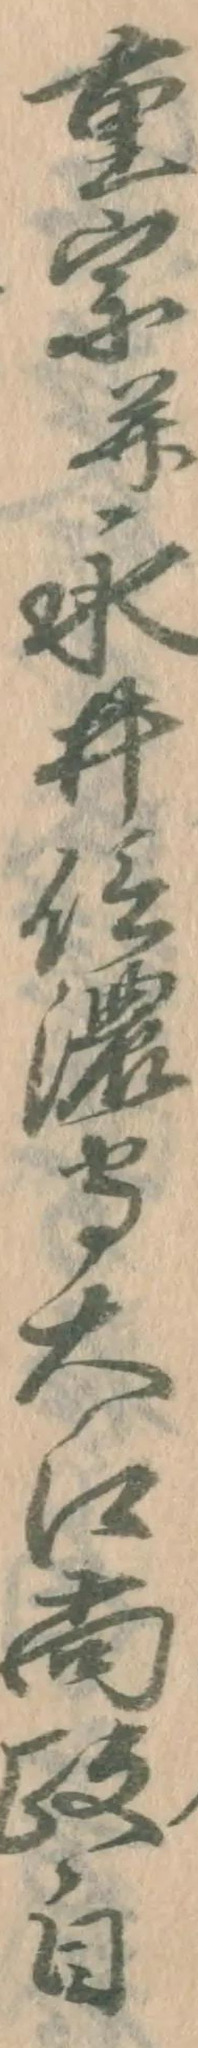重宗幷永井信濃守大江尚政自
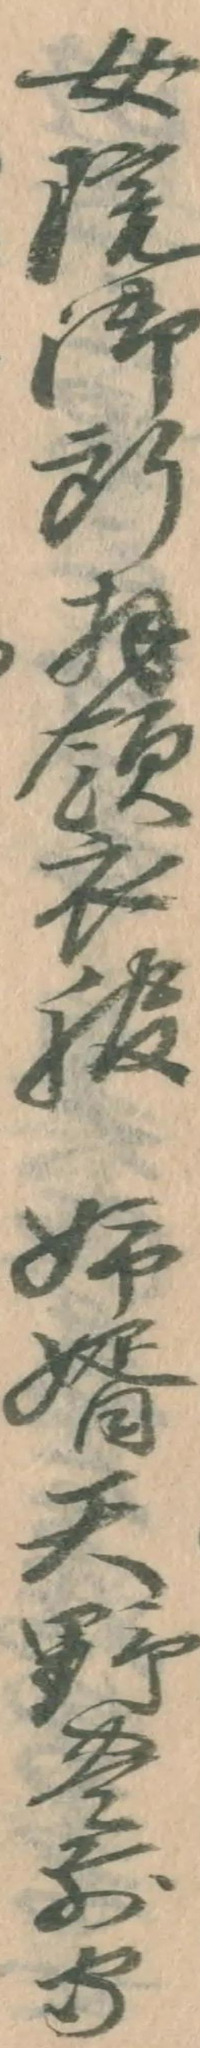女院御所拝領衣服姉婿天野豊前守
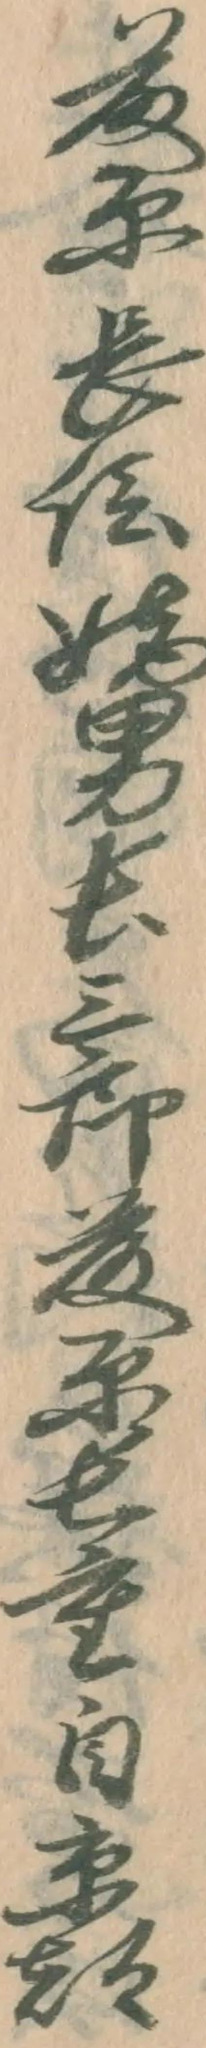藤原長信嫡男長三郎藤原長重事京都

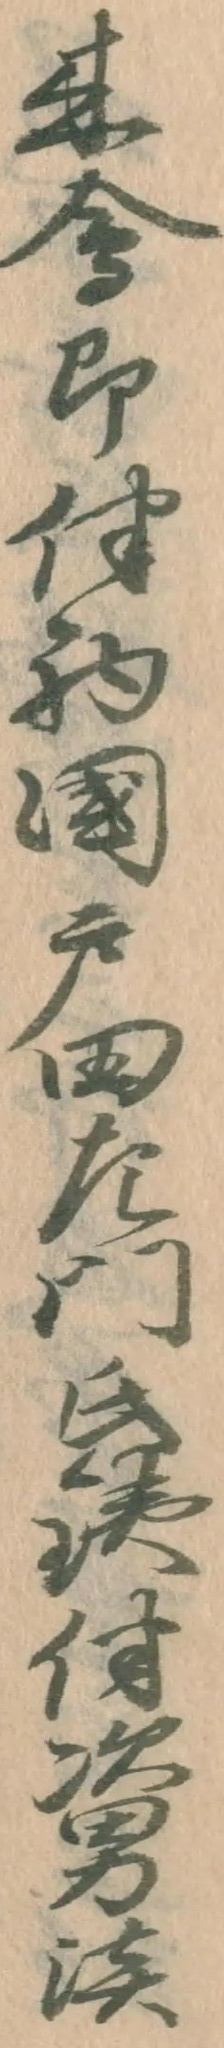来会即伴物図戸田左門氏鉄伴次男淡
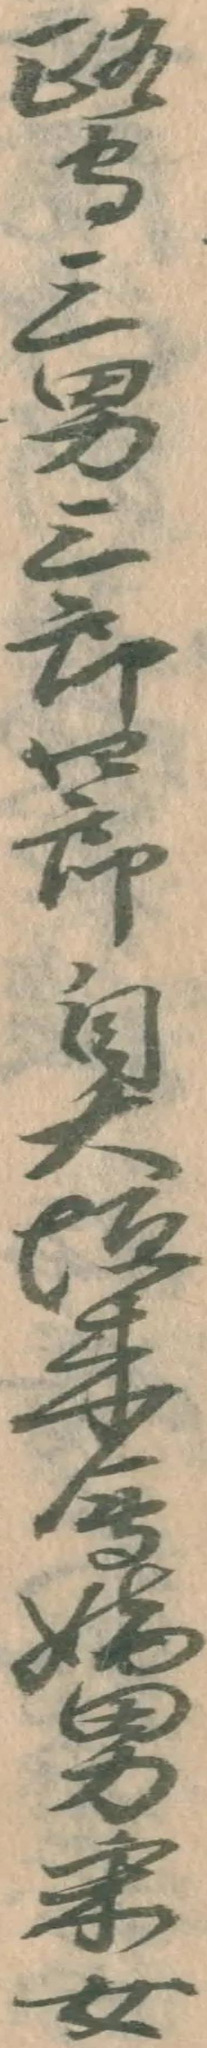路三男三郎四郎自大坂来会嫡男米女
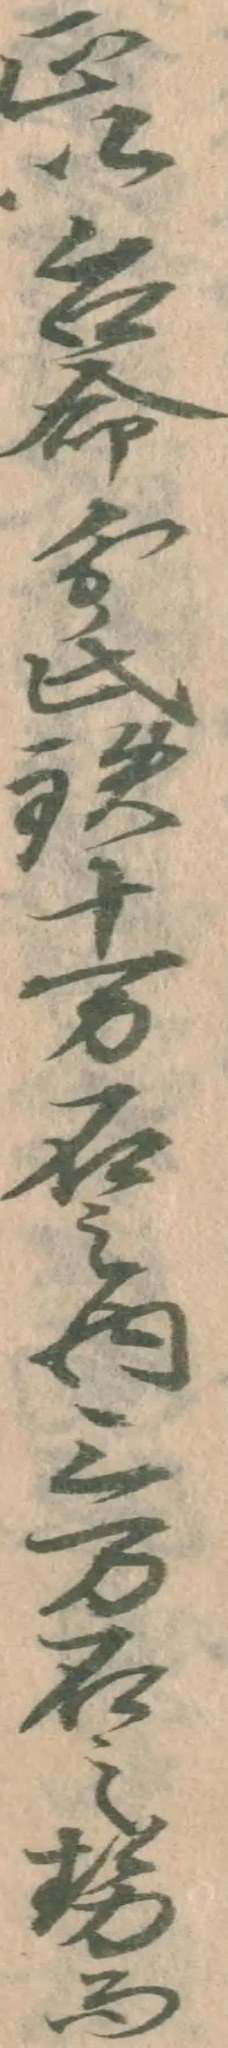正以召命分此鉄十万石之内三万石之勢而
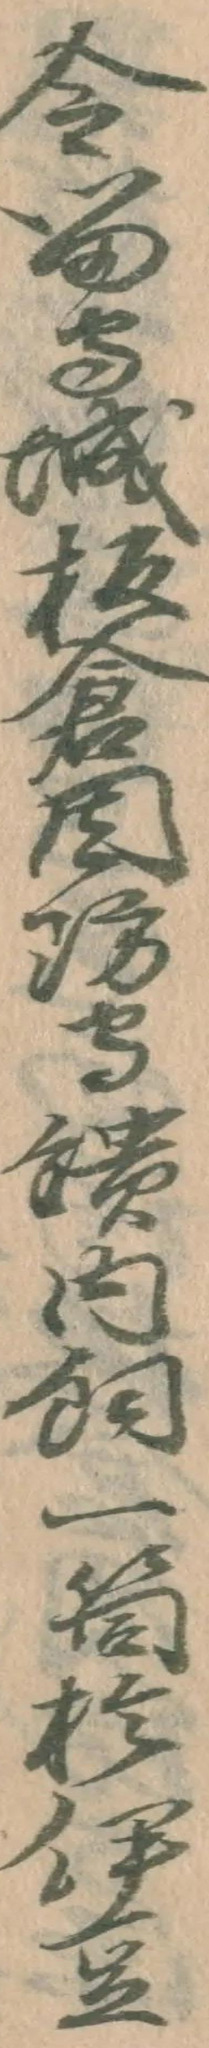令留守城板倉周防守饋内飼一筒於伊豆
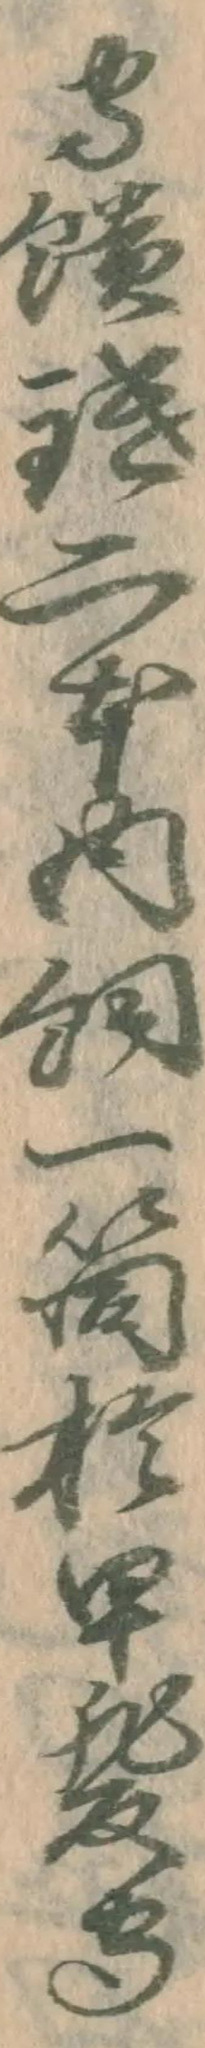守饋鑓二本内飼一筒於甲斐守
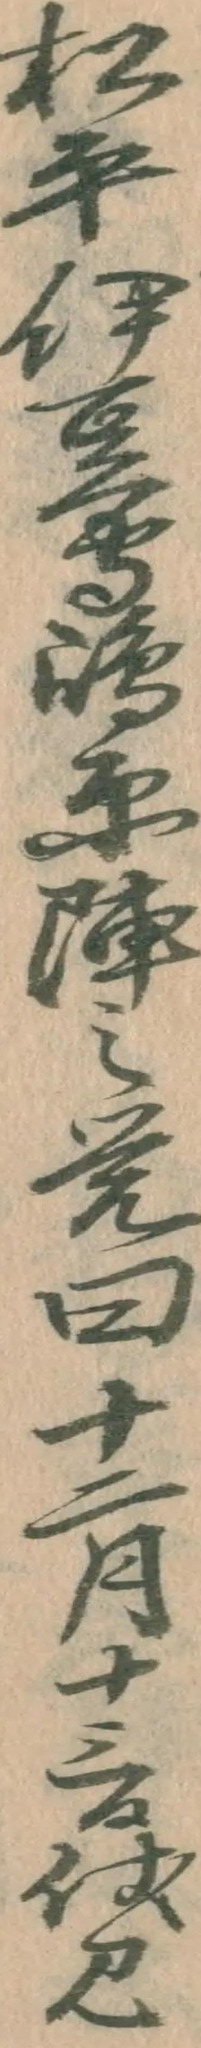松平伊豆守島原陣之覚曰十二月十三日伏見
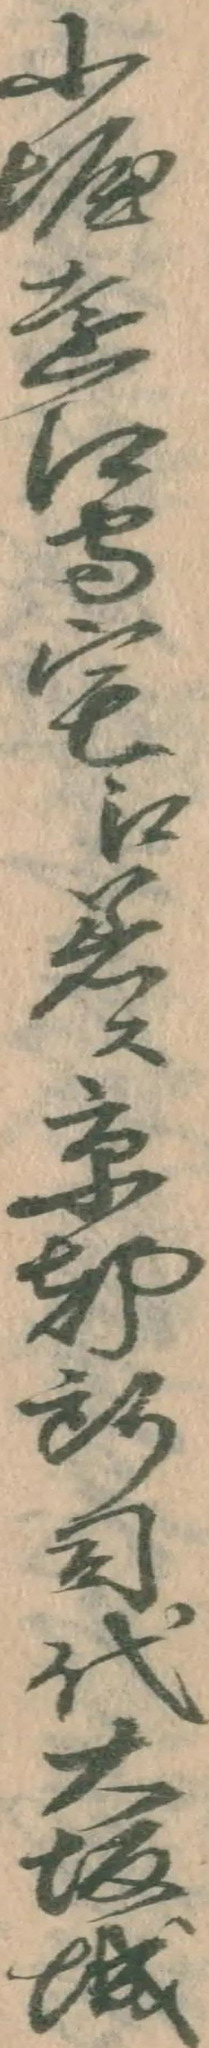小堀遠江守宅江着す京都所司代大坂城
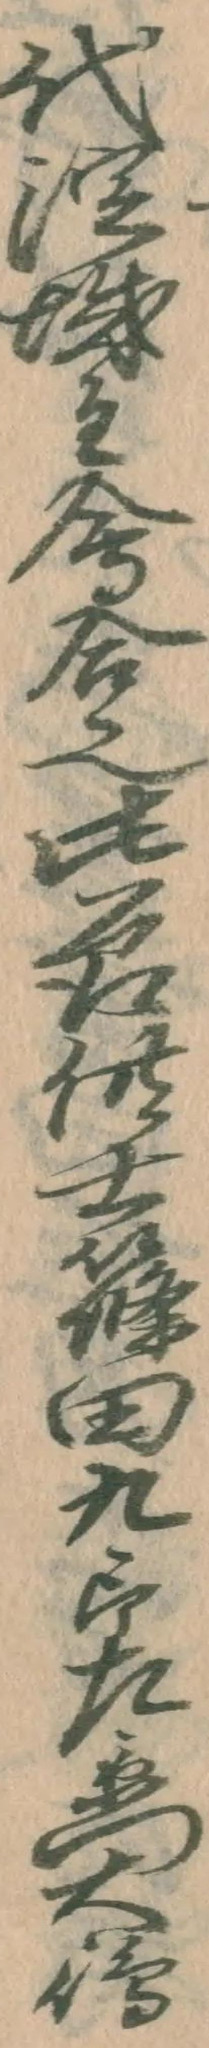代淀城主会合也此節供士篠田九郎左衛門大島
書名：切支丹御退治記 49巻. [4]
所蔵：国立国会図書館 National Diet Library, JAPAN
